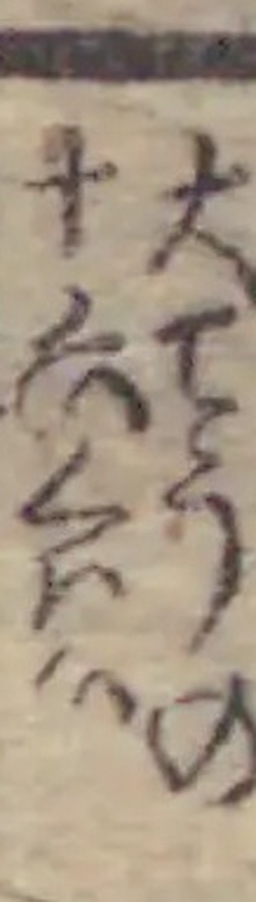十六くはい
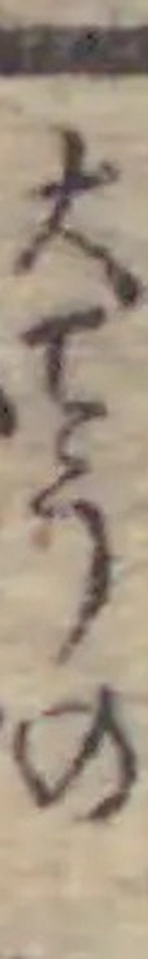大てうの
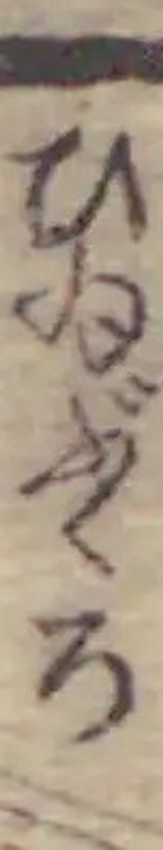ひゐぶくろ
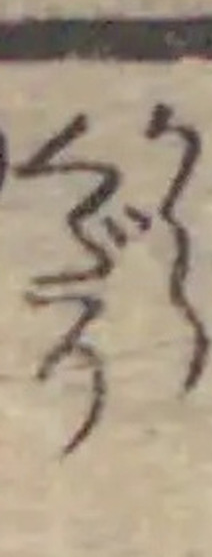くだり
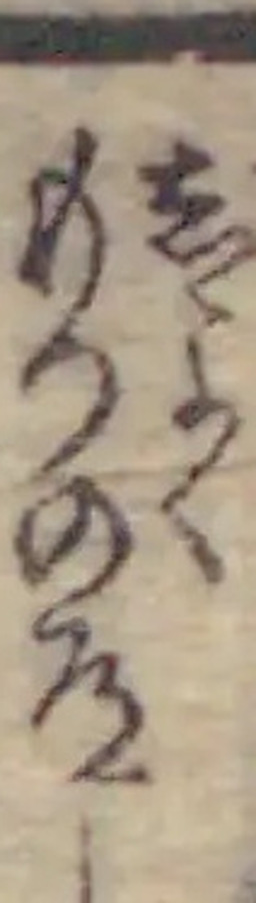もつの道
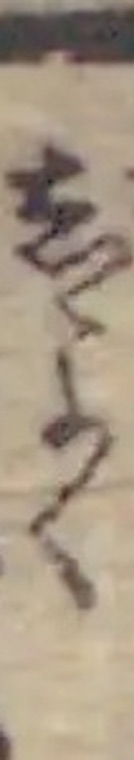しよく
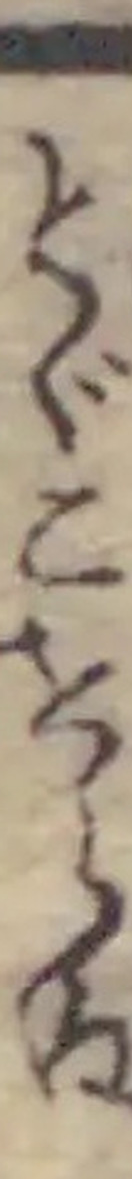とゞこをらぬ
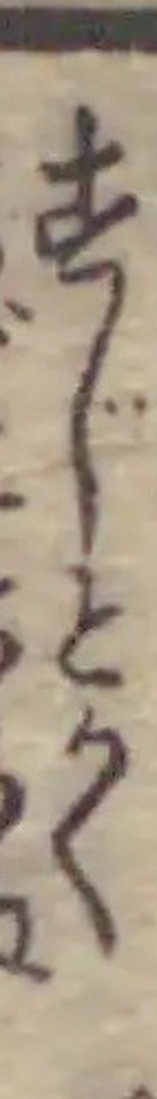すじとかく
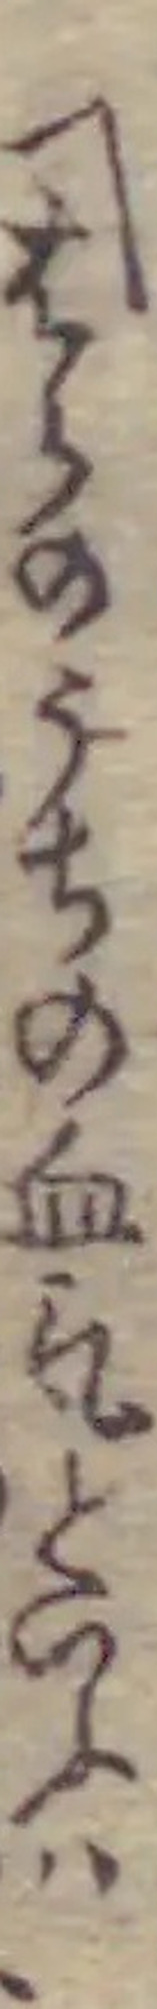〽はらのうちの血気といふは
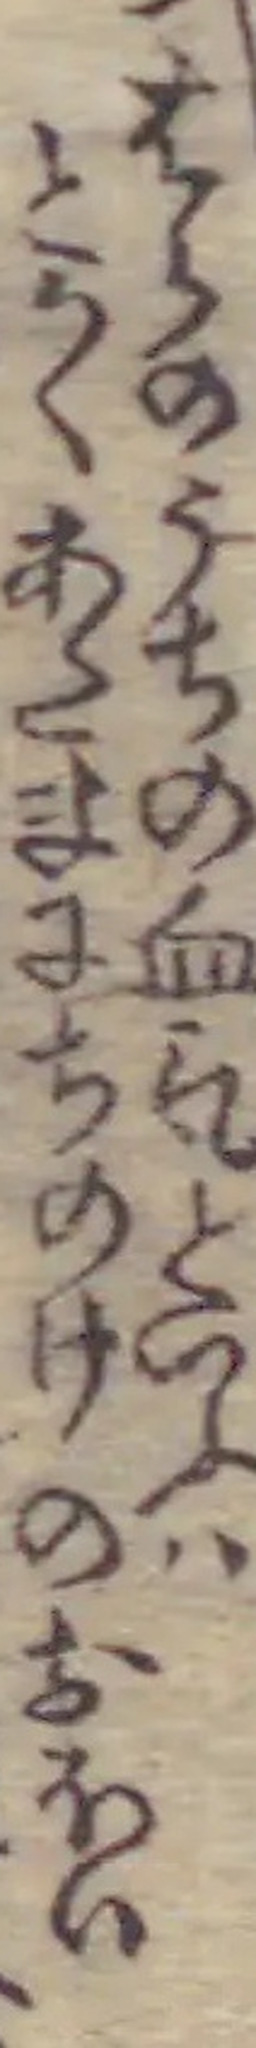とかくあたまにちのけのおほい
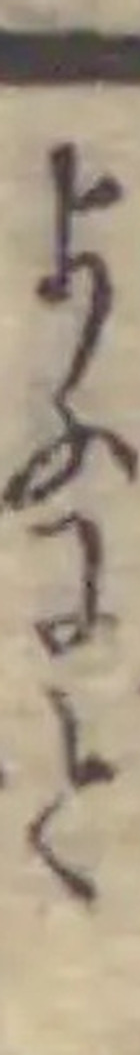よふにと
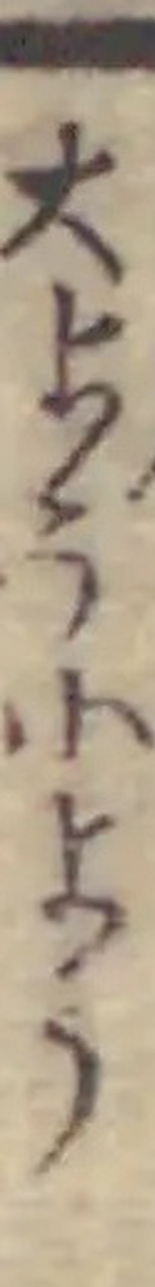大よう小よう
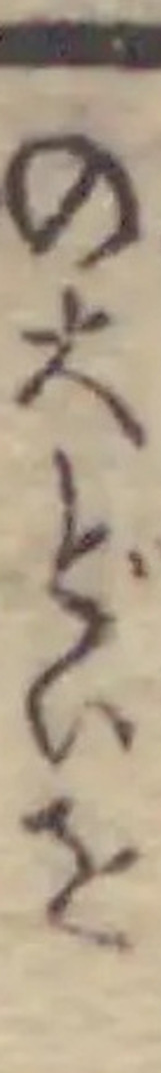の大どいを
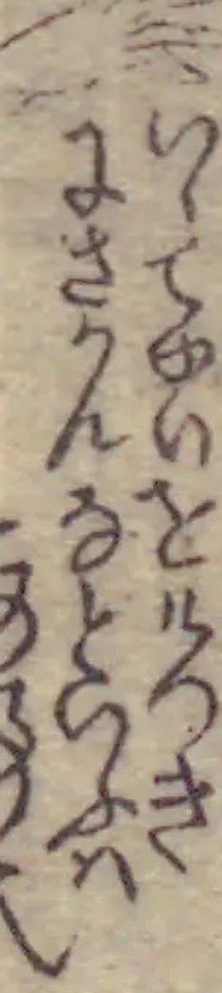にさかんなといふは
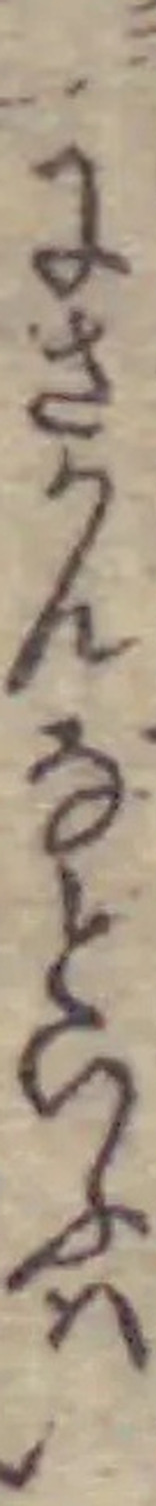にさかんなといふは
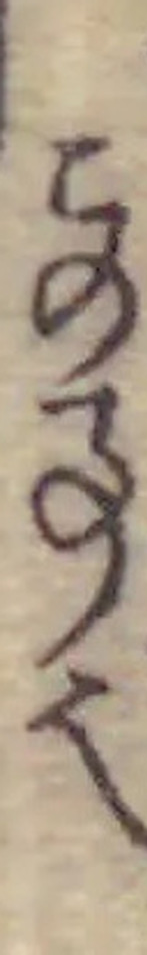この事也
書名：腹内養生主論 3巻
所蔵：国立国会図書館 National Diet Library, JAPAN
